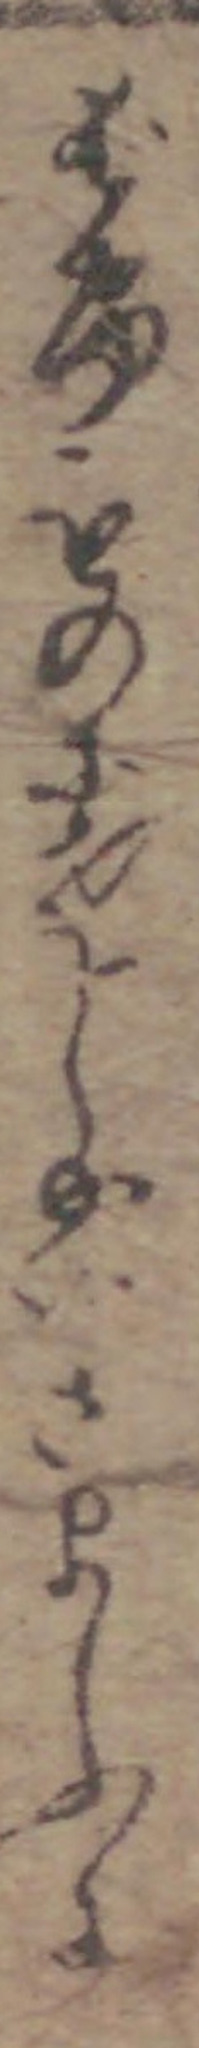はけものにしやいさよふに
